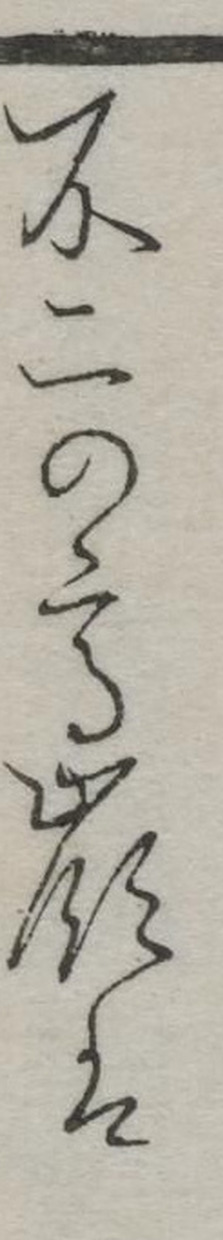不二の高嶺は
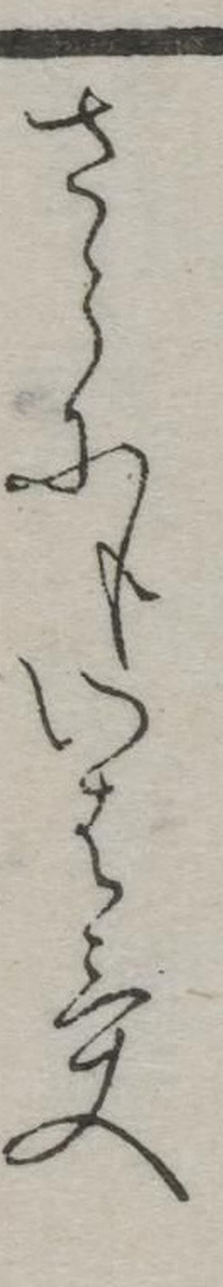さらにもいはす
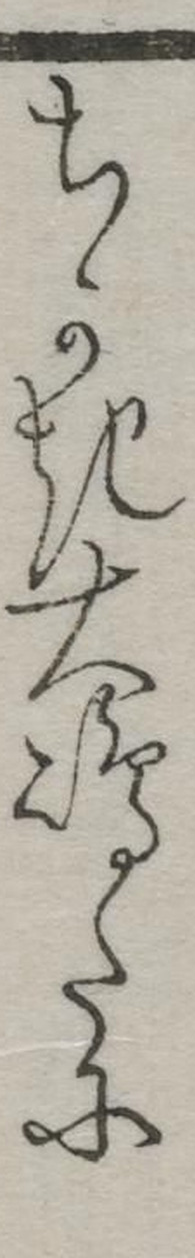ちかき大嶋たに
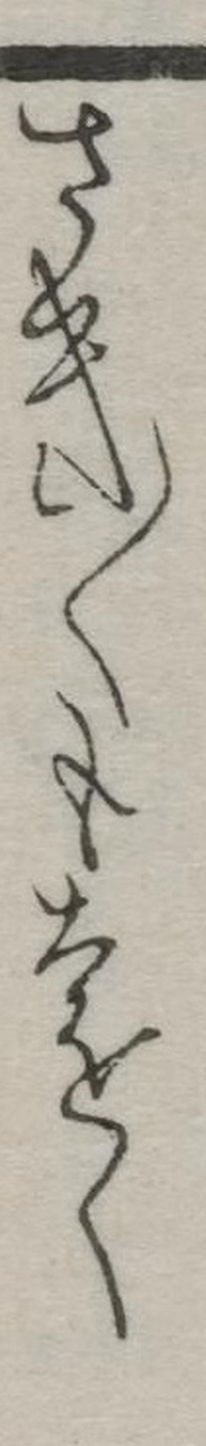さき〳〵も遠く
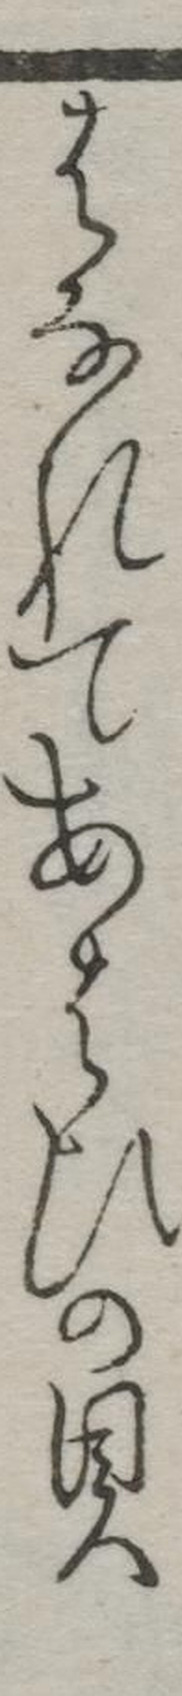はなれてあはひの貝
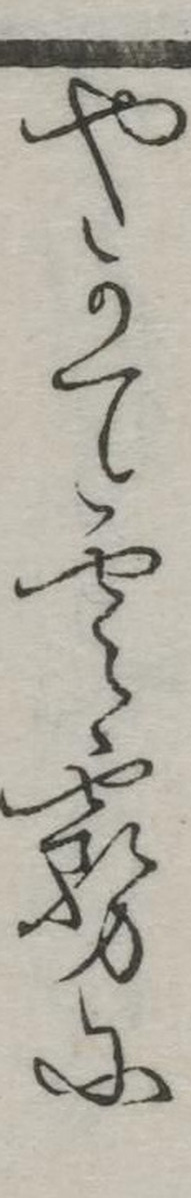やかて雲霧に
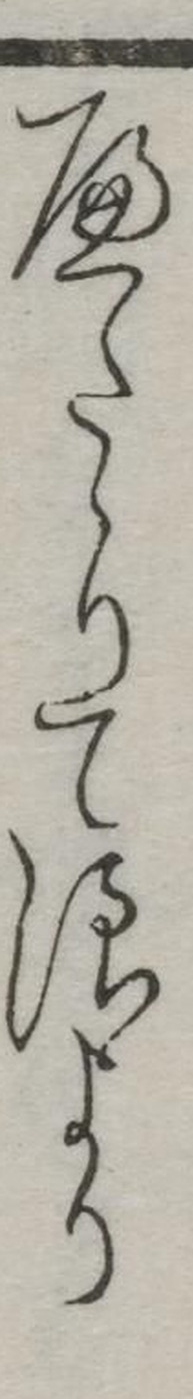へたゝりて浪より
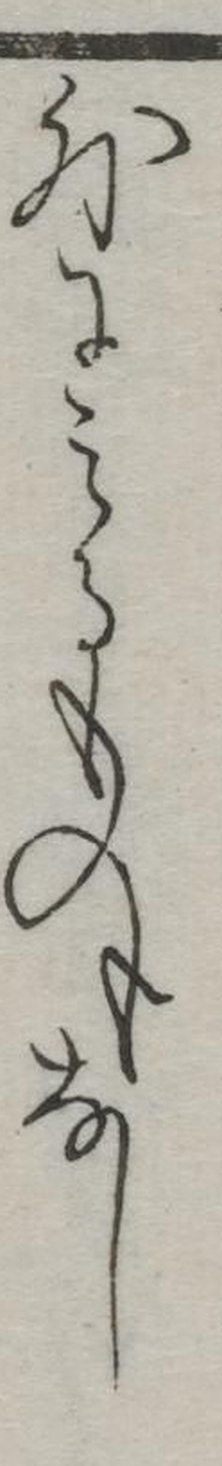外にみるものもなし
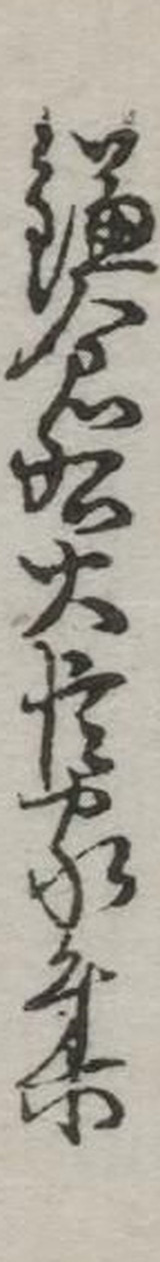鎌倉右大臣家集
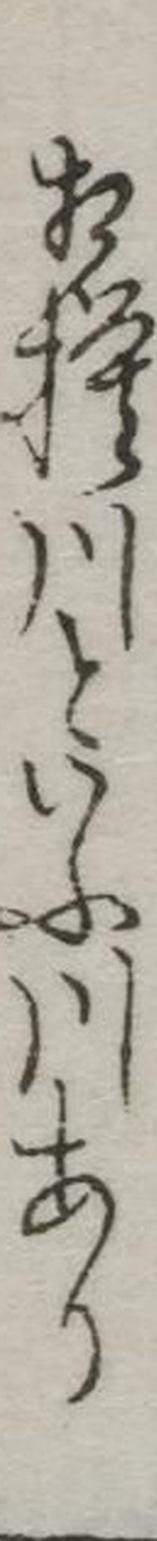相模川といふ川あり
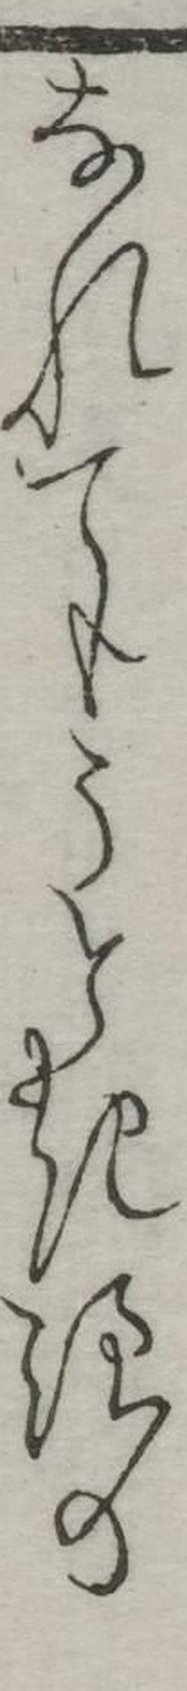なれてもうとき浪の
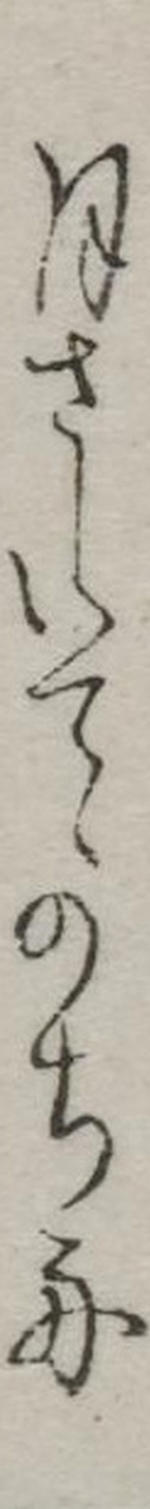月さしいてゝのち舟
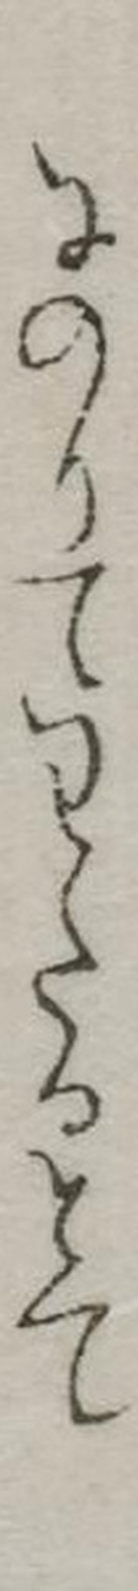にのりてわたるとて
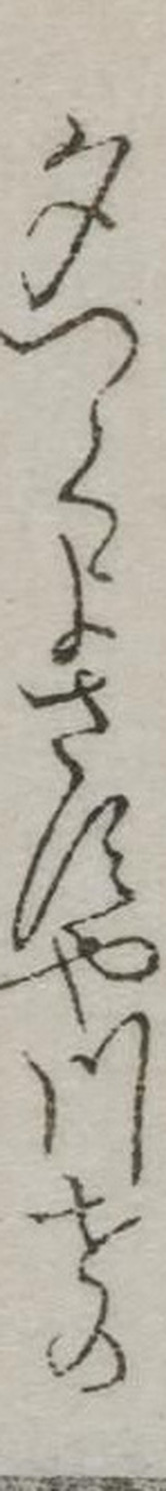夕つくよさすや川せの
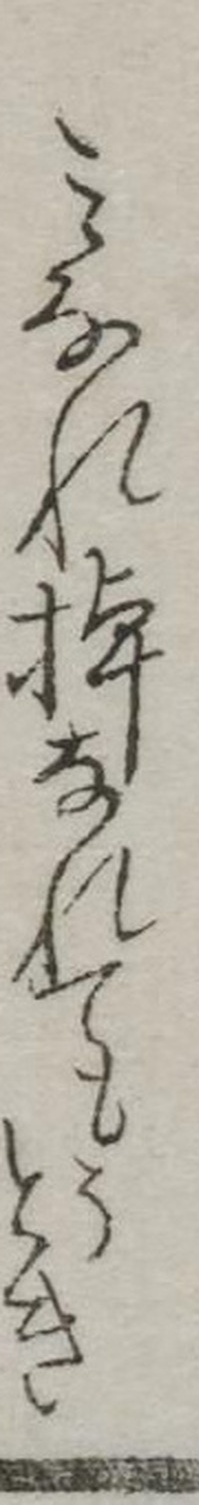みなれ棹なれてもうとき
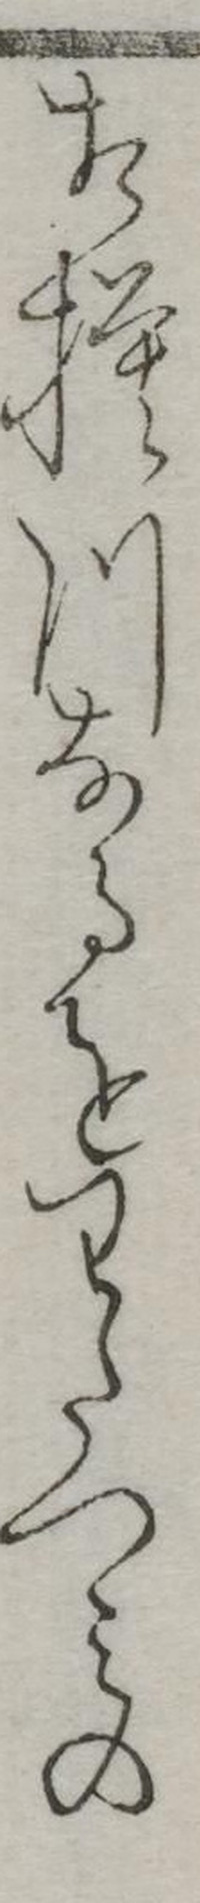相模川なるをわたつみの
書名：挿画熱海日記　全
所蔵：東京大学地震研究所図書室 Earthquake Research Institute Library, The University of Tokyo, JAPAN
